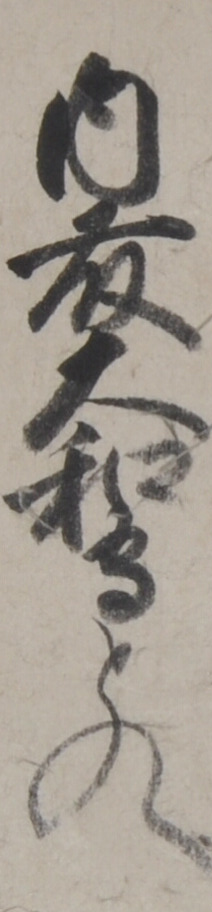内藤大和守とのへ

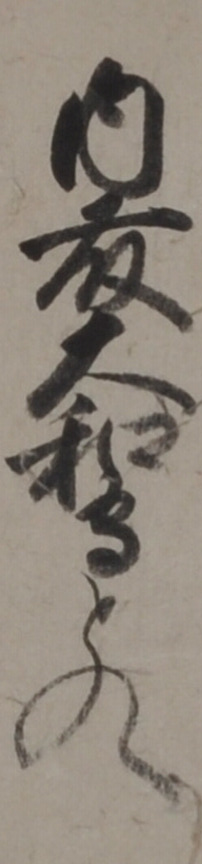内藤大和守とのへ

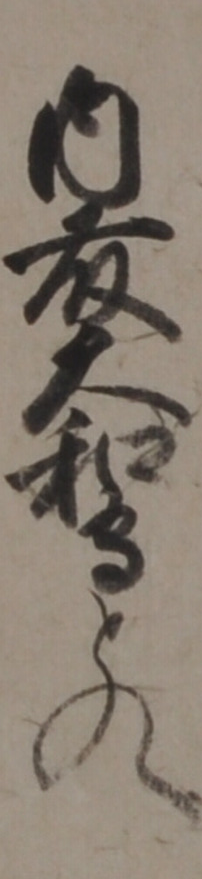内藤大和守とのへ
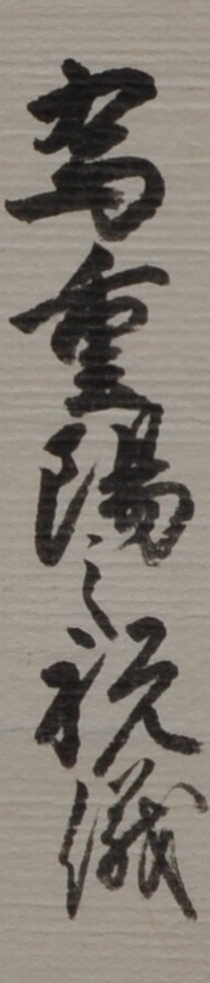為重陽之祝儀
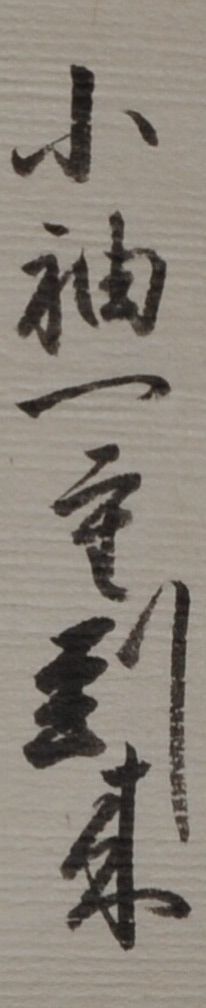小袖一重到来
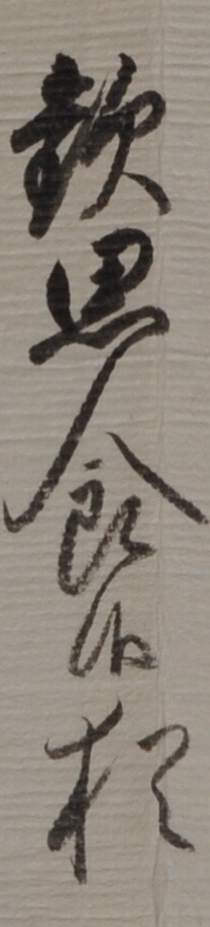歓思食候猶
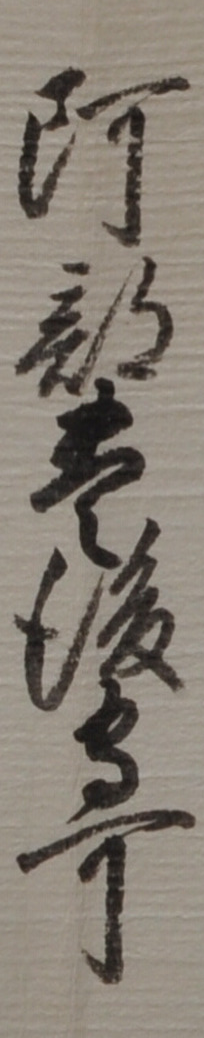阿部豊後守可
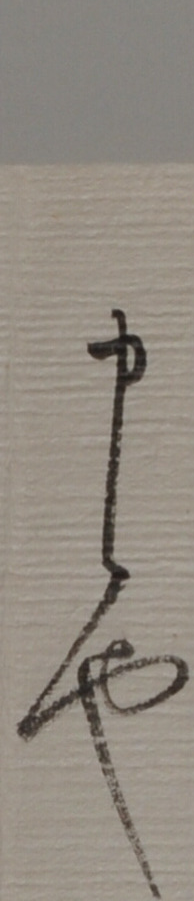申候也
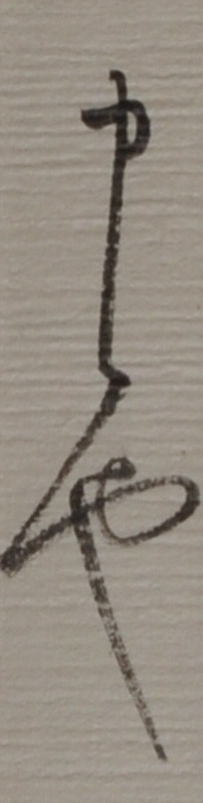申候也
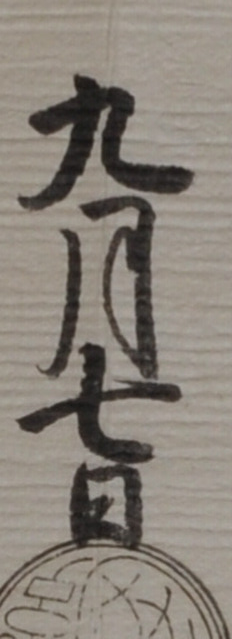九月七日
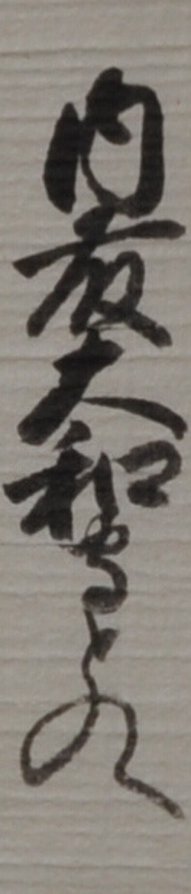内藤大和守とのへ
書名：御内書
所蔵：伊那市立高遠町図書館・合同会社AMANE
